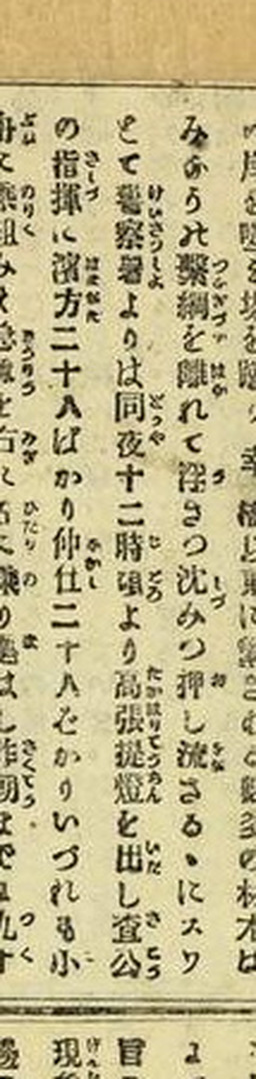とて警察署よりは同夜十二時頃より高張提燈を出し査公
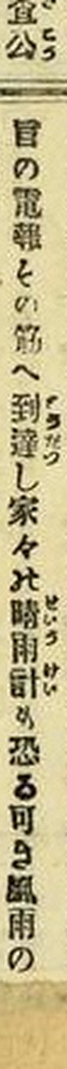旨の電報その筋へ到達し家々の晴雨計も恐る可き風雨の
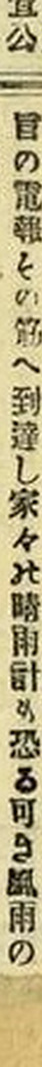旨の電報その筋へ到達し家々の晴雨計も恐る可き風雨の
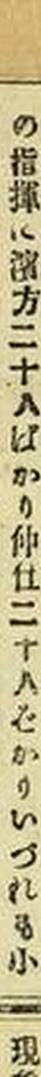の指揮に浜方二十人ばかり仲仕二十人ばかりいづれも小
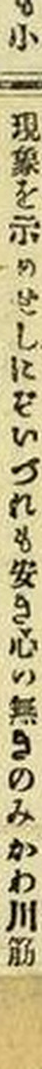現象を示めせしにぞいづれも安き心の無きのみかわ川筋
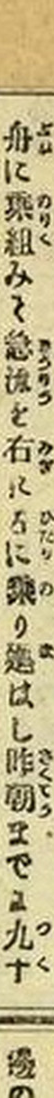舟に乗組みて急流を右に左に乗り廻はし昨朝までに九十
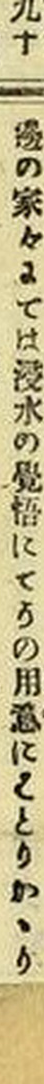辺の家々にては浸水の覚悟にてかの用意にはとりかゝり
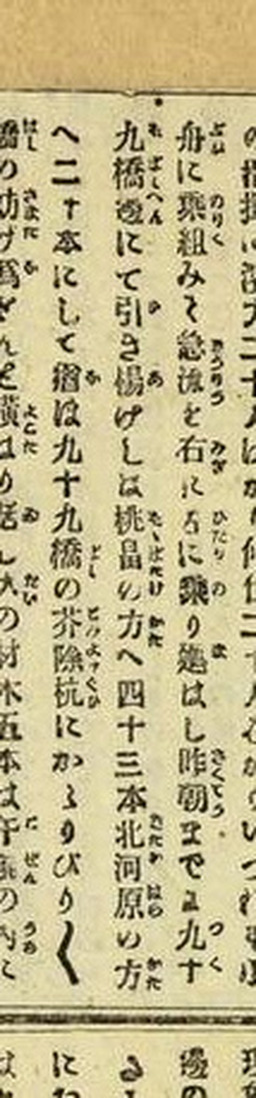九橋辺にて引き揚げしは桃畠の方へ四十三本北河原の方
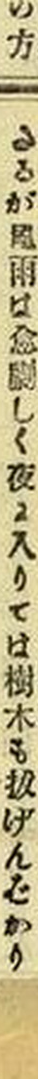たるが風雨は愈劇しく夜に入りては樹木も抜げんばかり
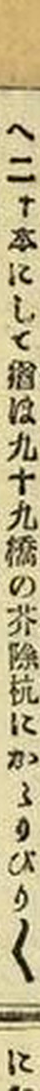へ二十本にして猶ほ九十九橋の芥除杭にかゝりびり〳〵
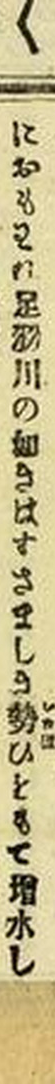におもわれ足羽川の如きはすさましき勢ひをもて増水し
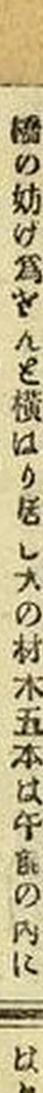橋の妨げ為さんと横はり居し大の材木五本は午前の内に
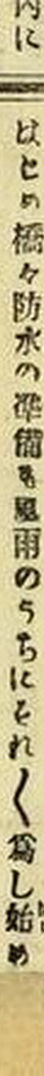はじめ橋々防水の準備も風雨のうちにそれ〳〵為し始め
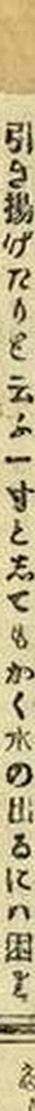引き揚げたりと云ふ一寸としてもかく水の出るには困つ
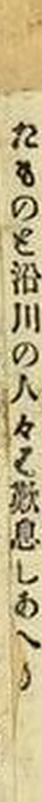たものと沿川の人々は嘆息しあへり
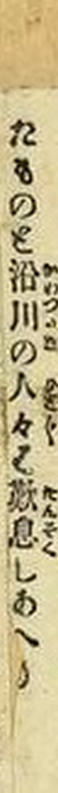たものと沿川の人々は嘆息しあへり
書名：温古集 五巻
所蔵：福井県文書館 Fukui Prefectural Archives
